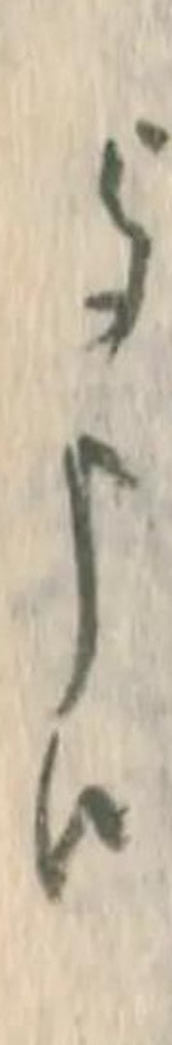と申候

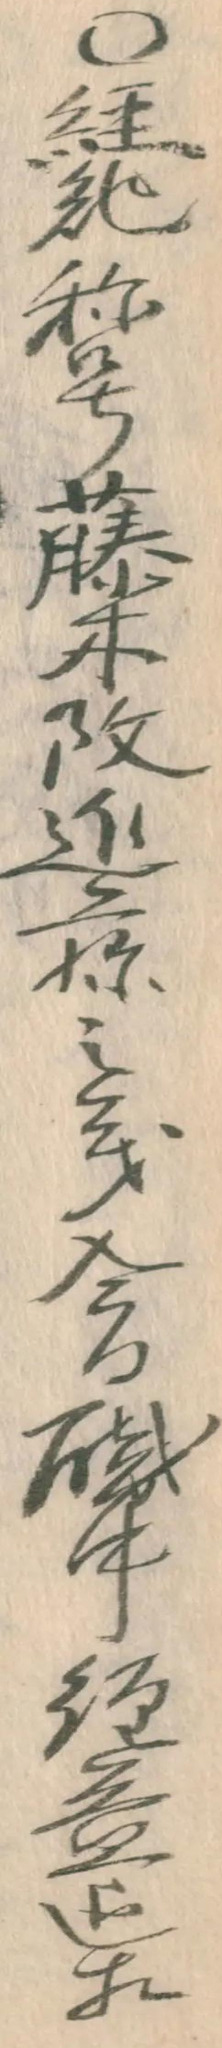○経紀称号藤木改近藤之義今日職中経益迄相
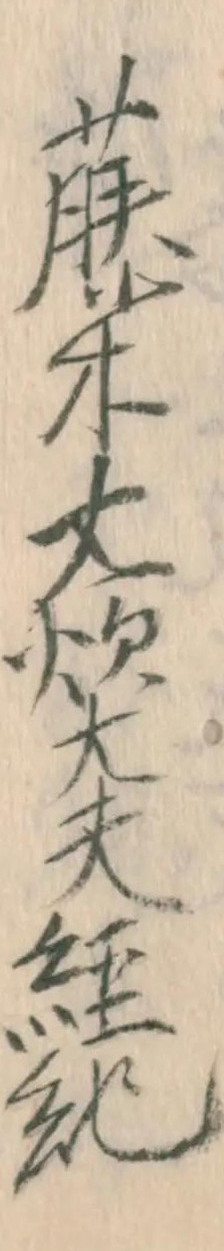藤木大炊大夫経紀
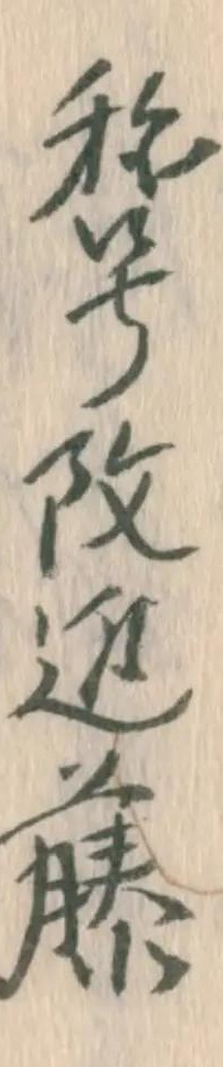称号改近藤
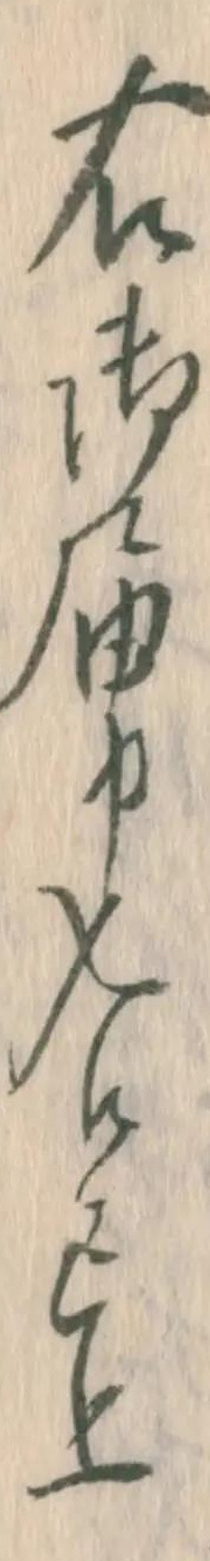右御届申入候已上
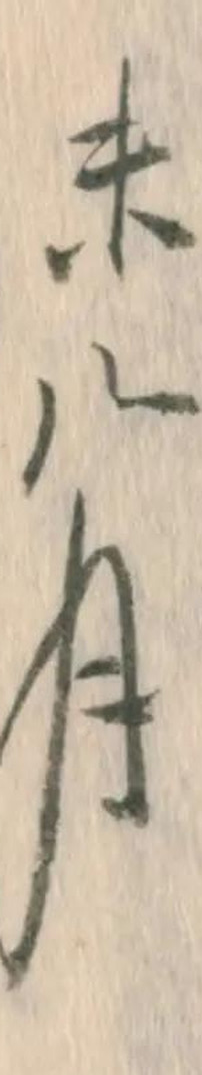未八月
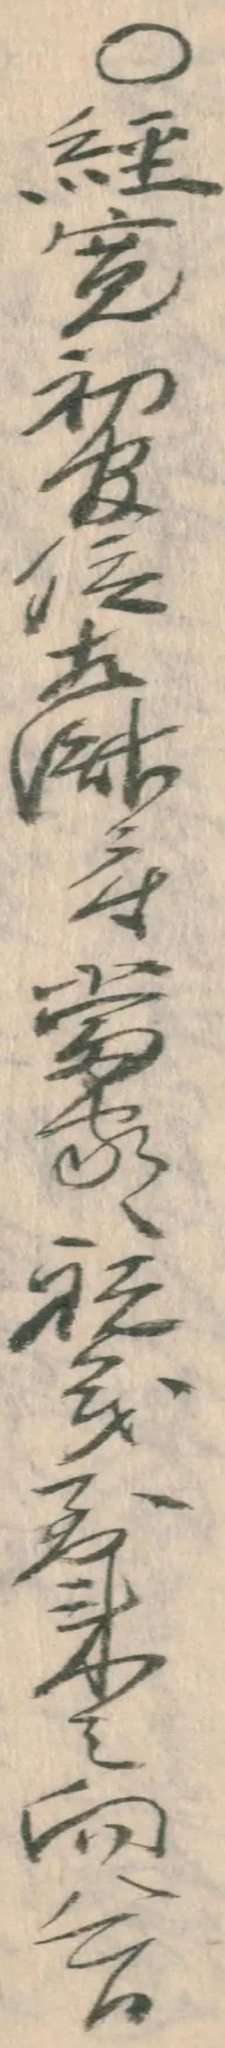○経寛初官位相済ニ付當家へ祝義到来之向ヘ今日
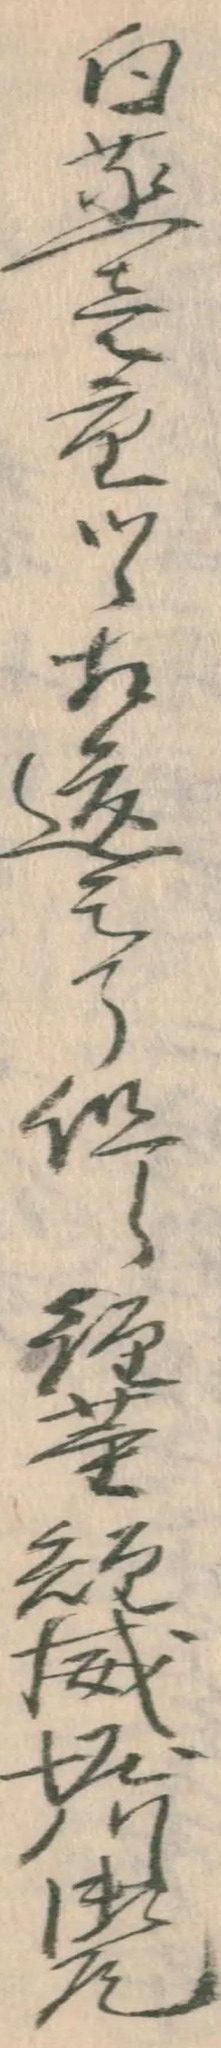白蒸壱重ツヽ相返之了但し経董経威堀川瀬尾
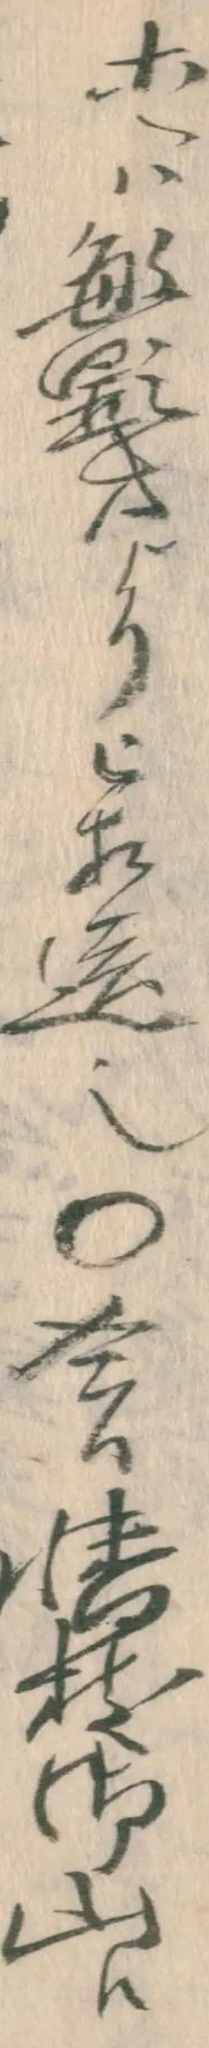等へハ敏顕方より被相送也〇今日幡枝御山え
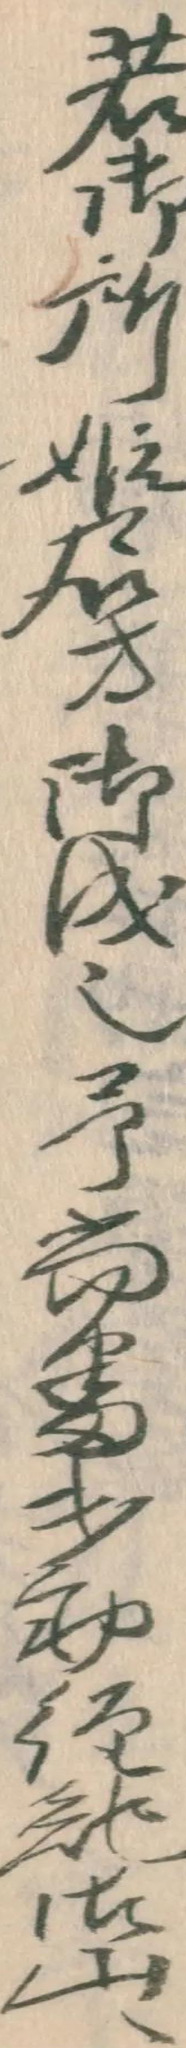若御所姫君方御成也予當番出勤経紀御山へ
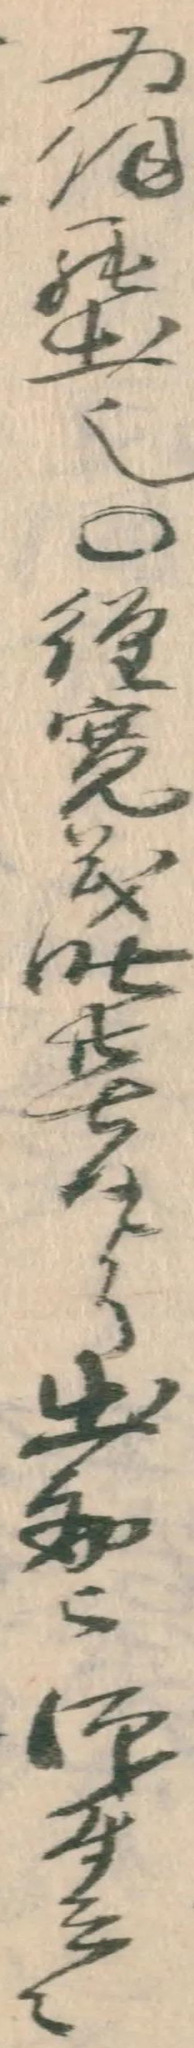為伺罷出也○経寛義昨廿七日より出勤被仰付云々
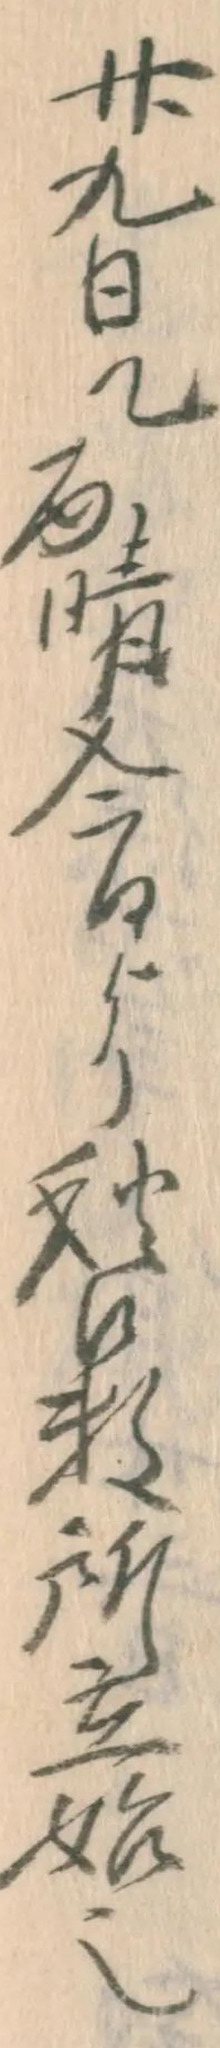廿九日乙酉晴今日より秋日数所立始也
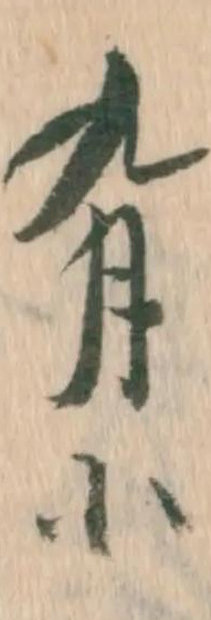九月小
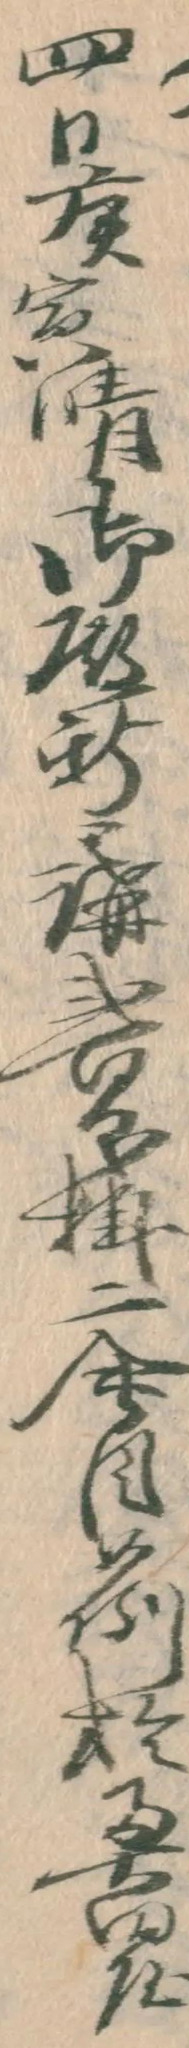四日庚寅晴御殿新之講弐百匁掛二會目如例於奥田屋
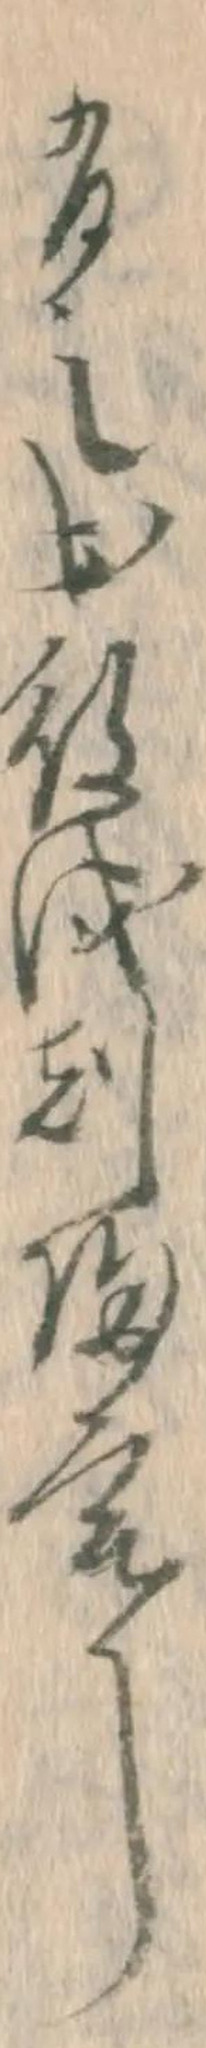有之出役戌刻帰宅了
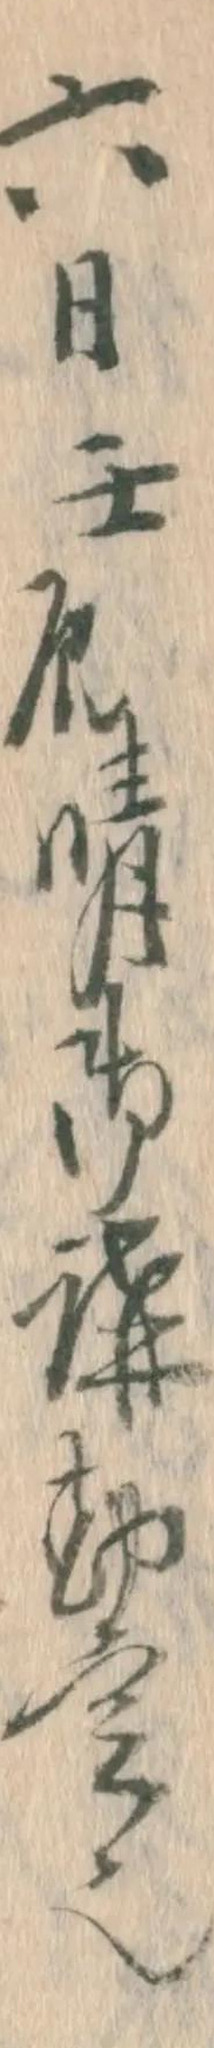六日壬辰晴御講勘定也
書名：賀茂社記録. 第67冊
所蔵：国立国会図書館 National Diet Library, JAPAN
